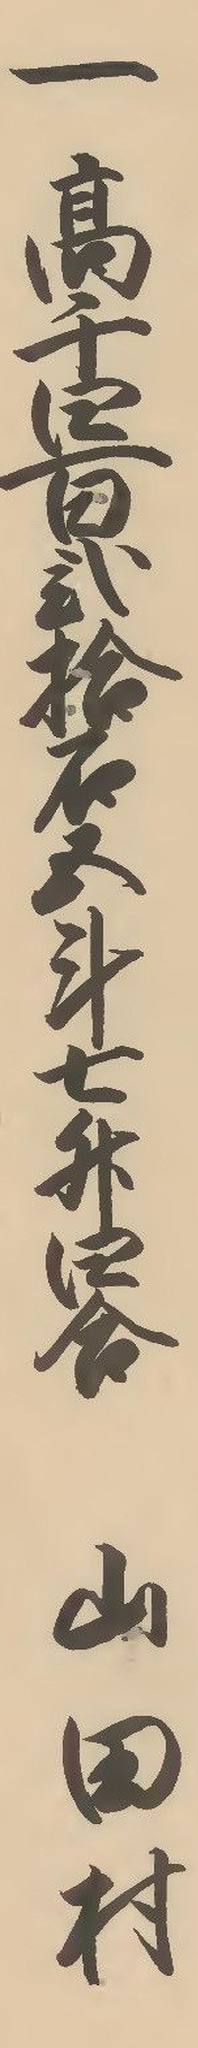一高千四百弐拾石五斗七升四合山田村

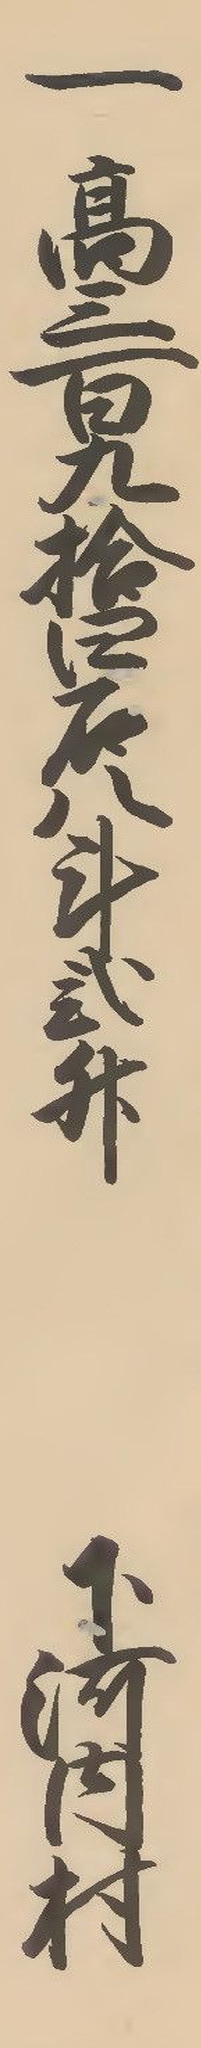一高三百九拾四石八斗弐升下河内村
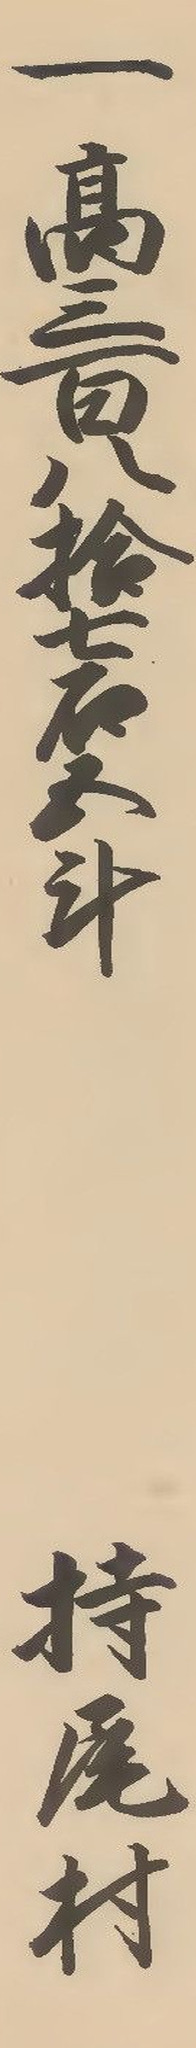一高三百八拾七石五斗持尾村
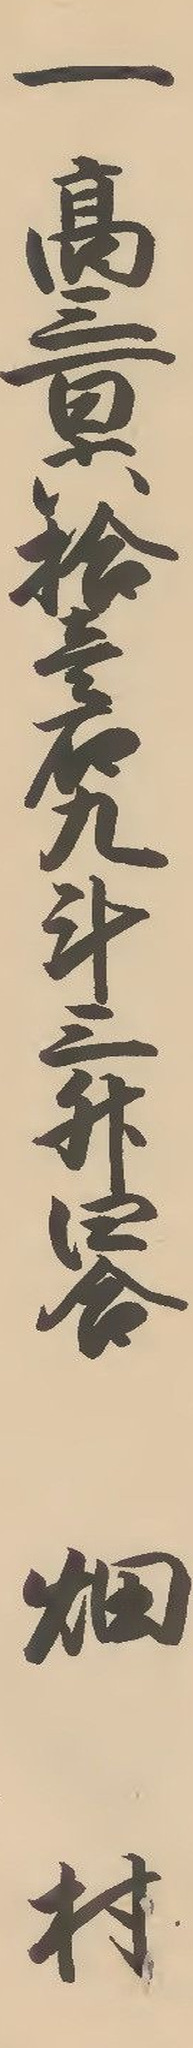一高三百六拾壱石九斗三升四合畑村
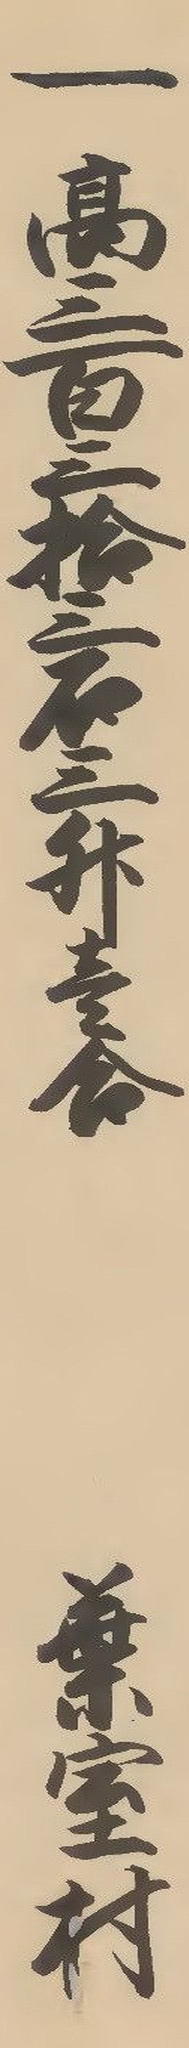一高三百三拾三石三升壱合葉室村
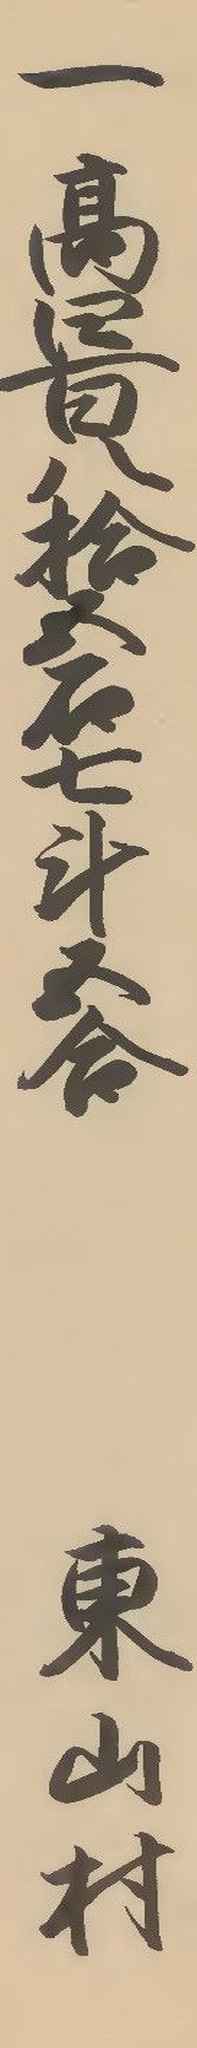一高四百八拾五石七斗五合東山村
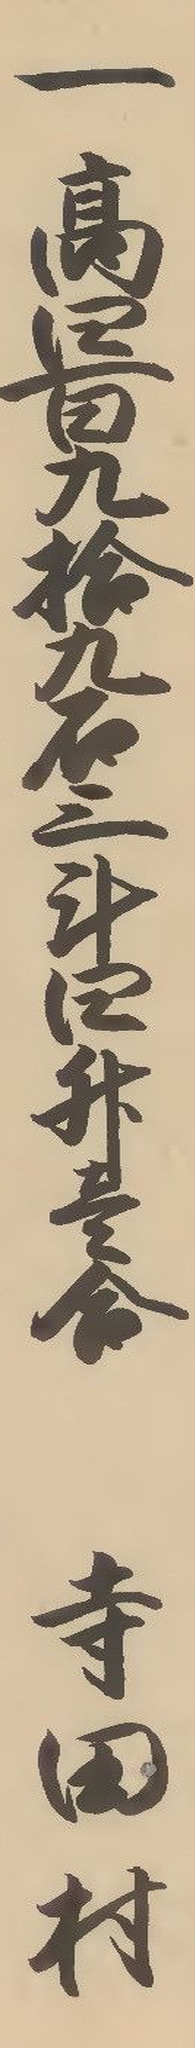一高四百九拾九石三斗四升壱合寺田村
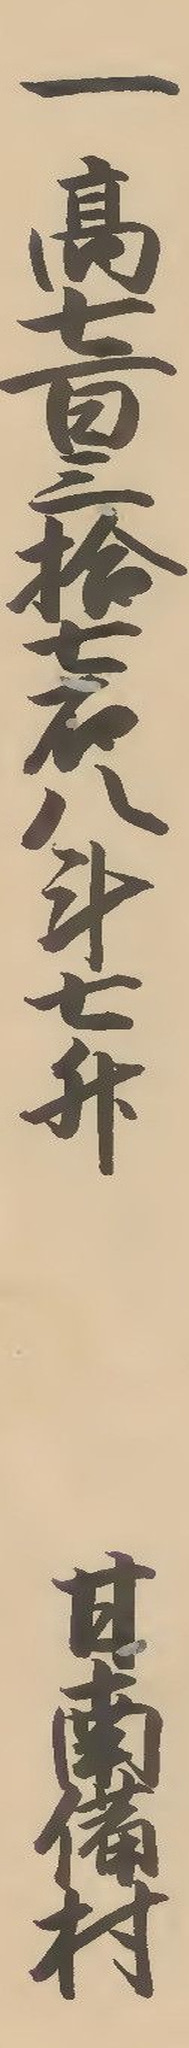一高七百三拾七石八斗七升甘南備村

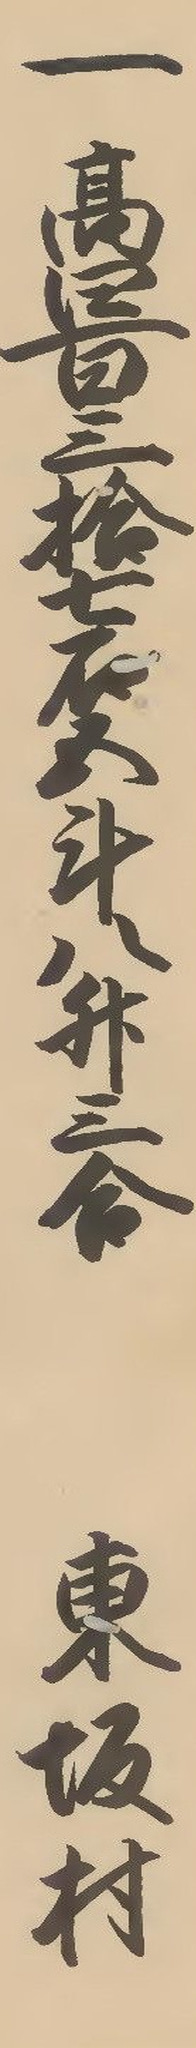一高四百三拾七石五斗八升三合東坂村
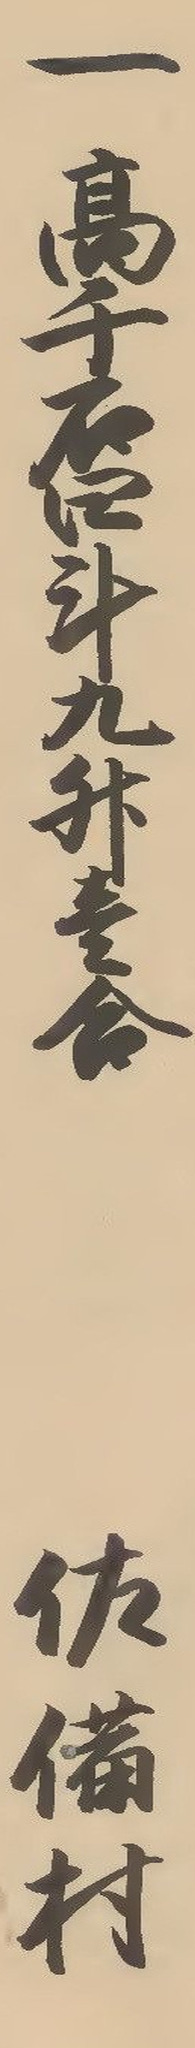一高千石四斗九升壱合佐備村
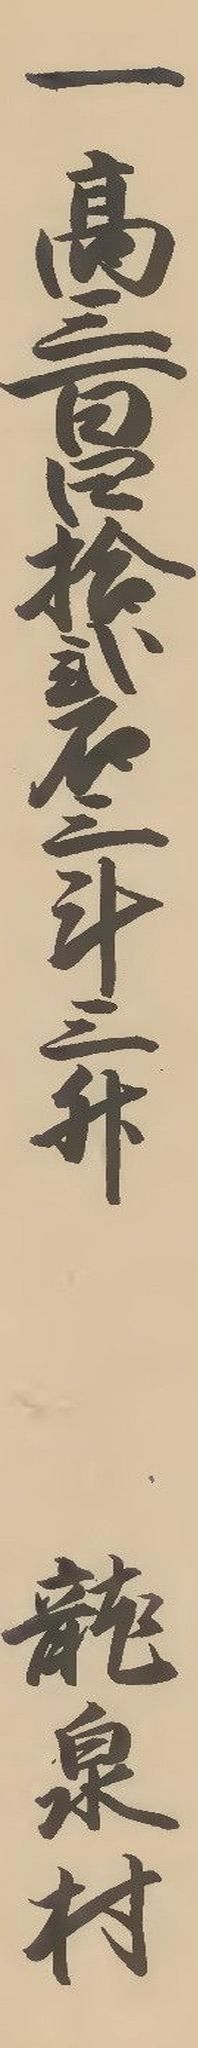一高三百四拾弐石三斗三升竜泉村
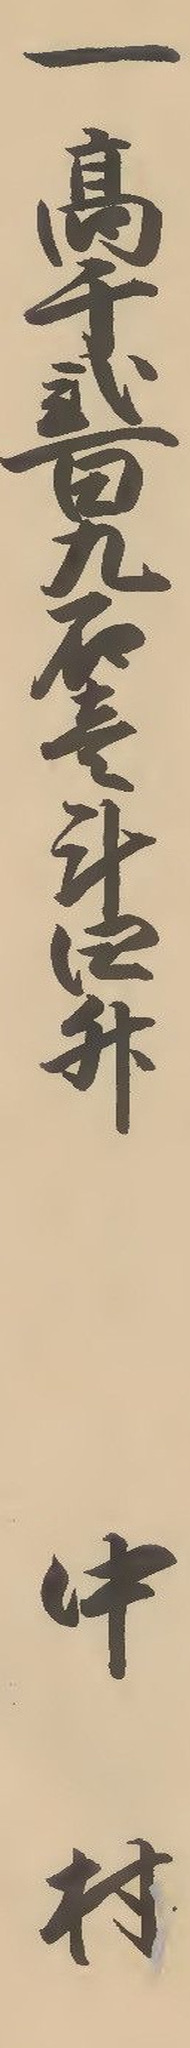一高千弐百九石壱斗四升中村
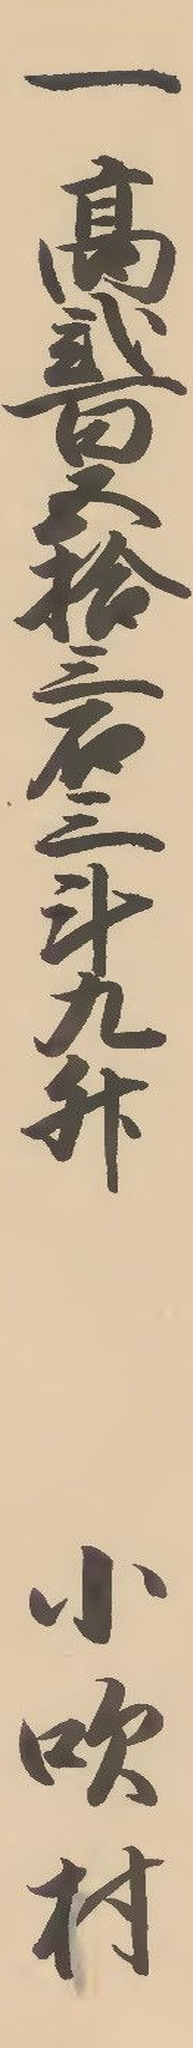一高弐百五拾三石三斗九升小吹村
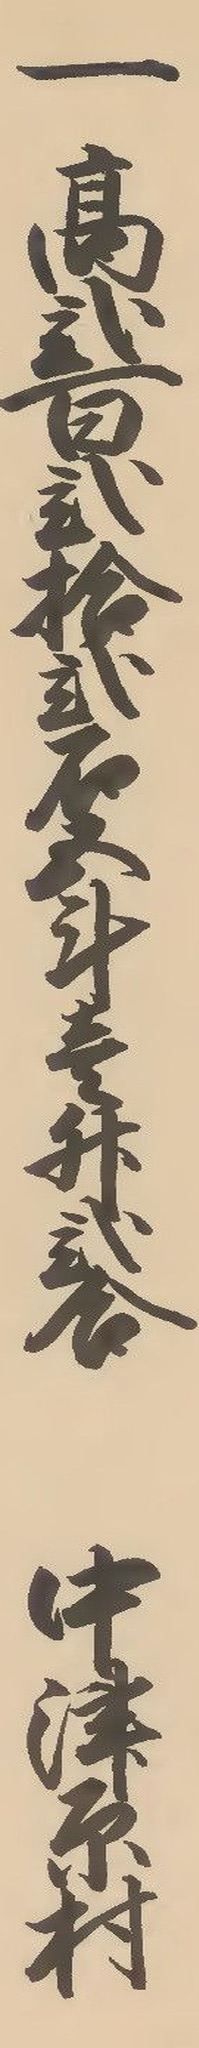一高弐百弐拾弐石五斗壱升弐合中津原村
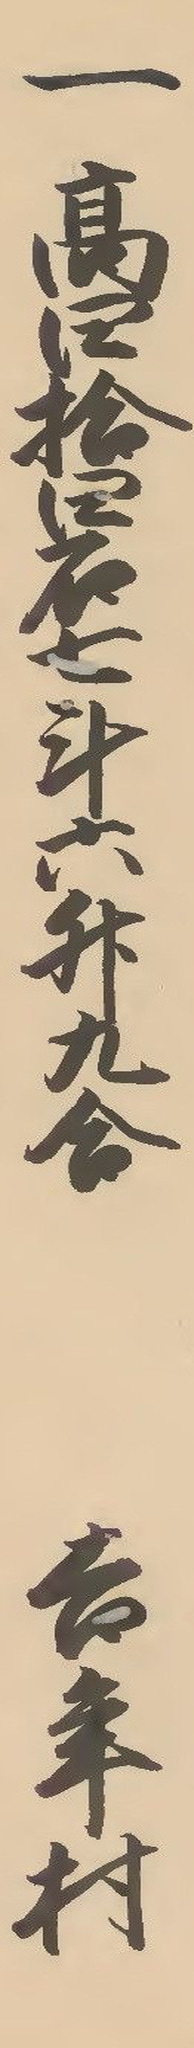一高四拾四石七斗六升九合吉年村

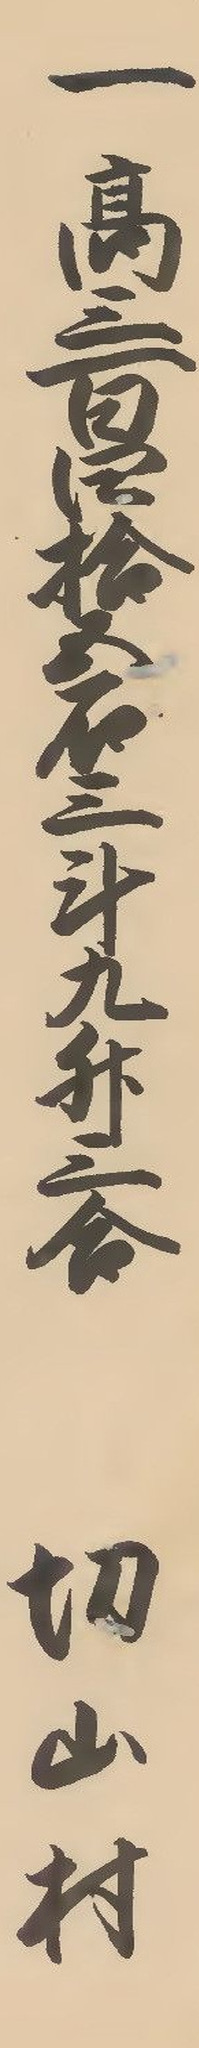一高三百四拾五石三斗九升三合切山村
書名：河内国郷帳
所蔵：国立公文書館 National Archives of Japan
